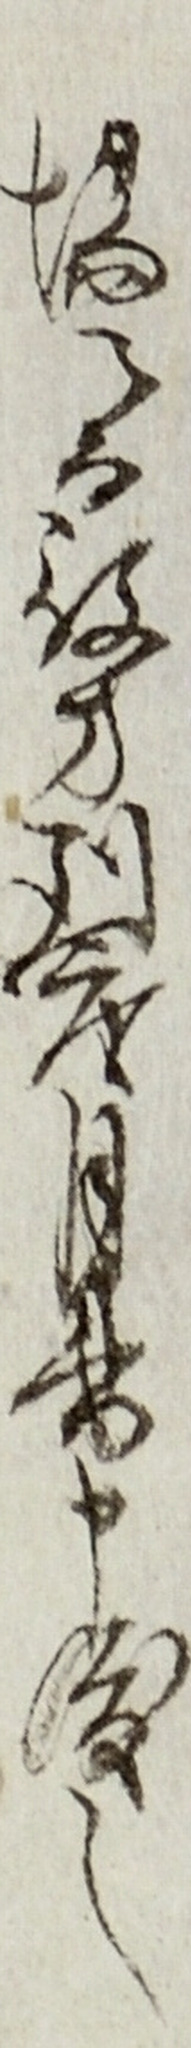場ニ而役方列座月番申渡之候
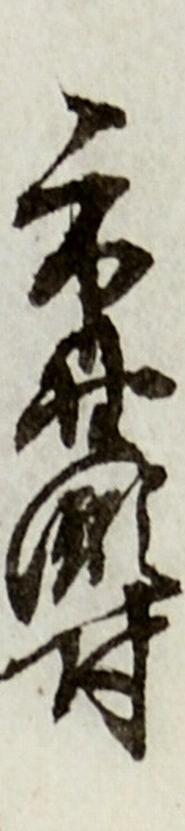市野瀬村
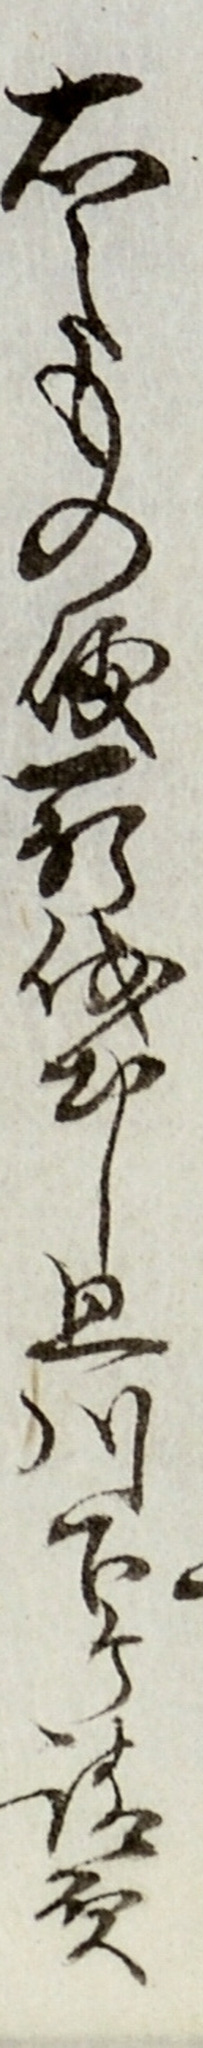右之もの儀薪伐出し且川下ケ請負
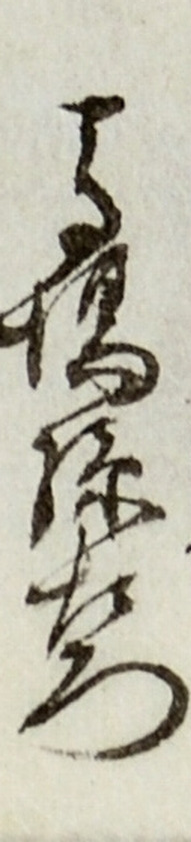馬場源左衛門
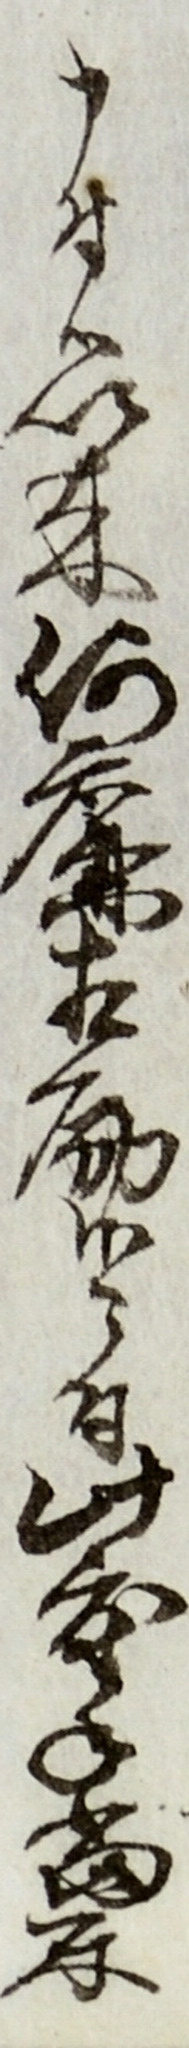申付候以来何廉相励候ニ付此度手当米
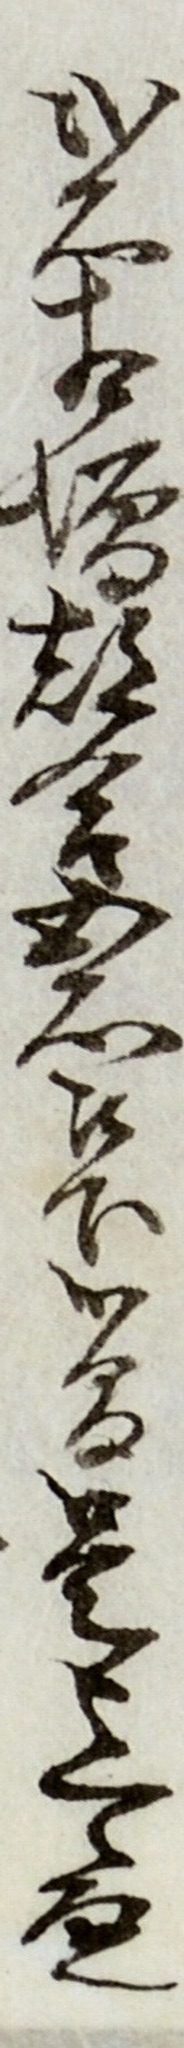弐石相増都合五石被下候間是迄之通
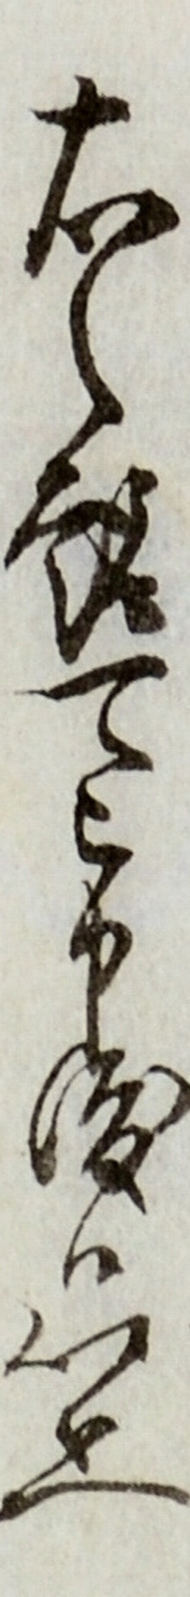右之趣可被申渡候以上
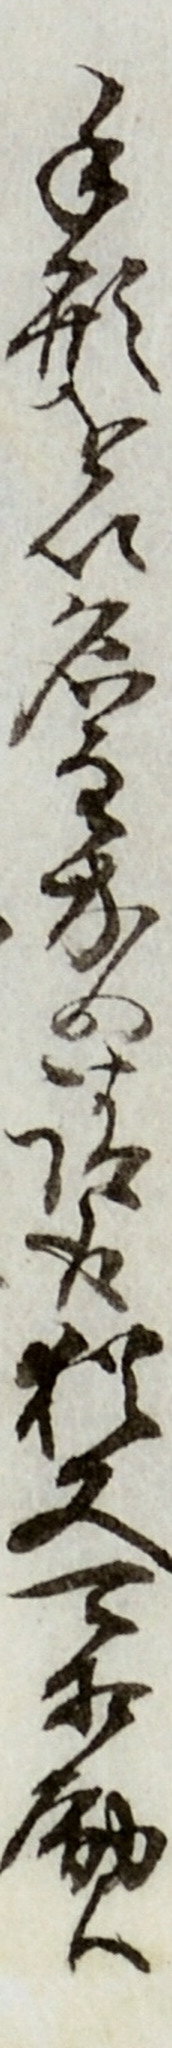手形を以名主方ゟ請取猶又可相励候
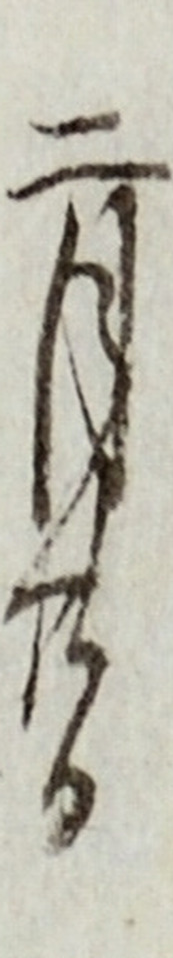二月廿日
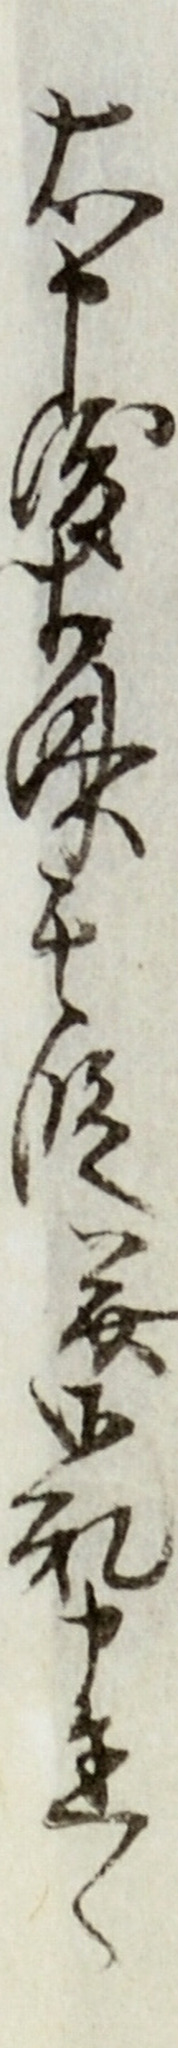右申渡相済其段并御礼申達候
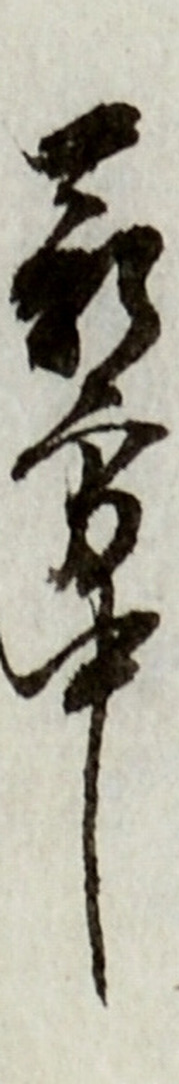薪方中
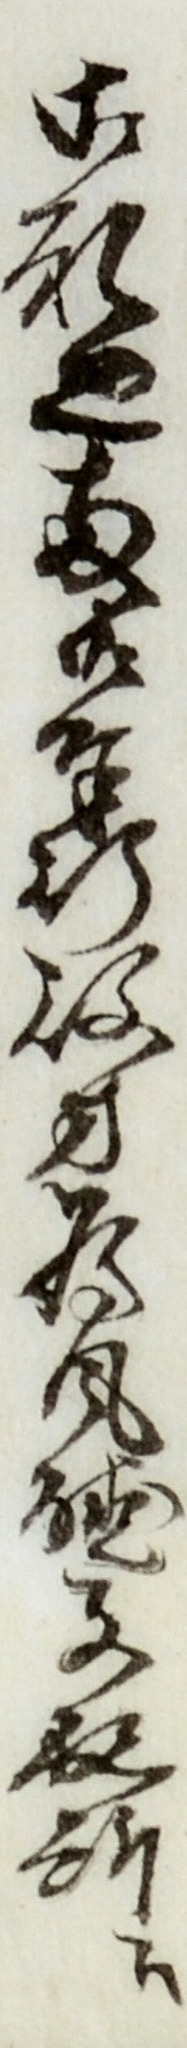御礼迄両御奉行役方為風聴支配所江
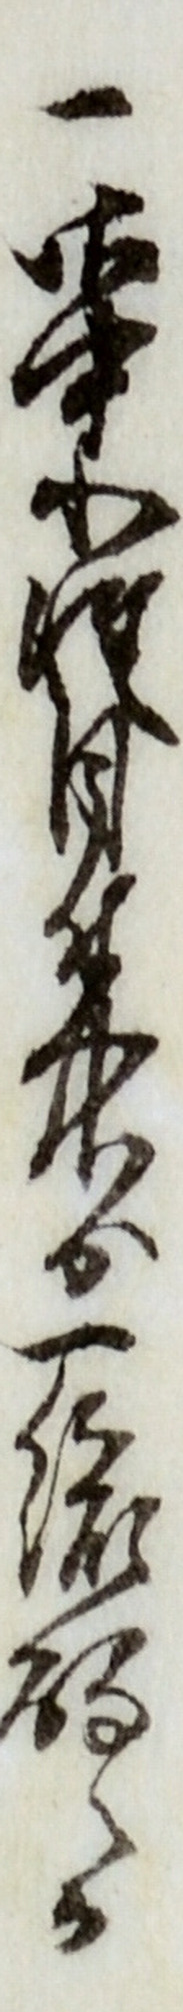一御中小性目付中ゟ一統触ニ而
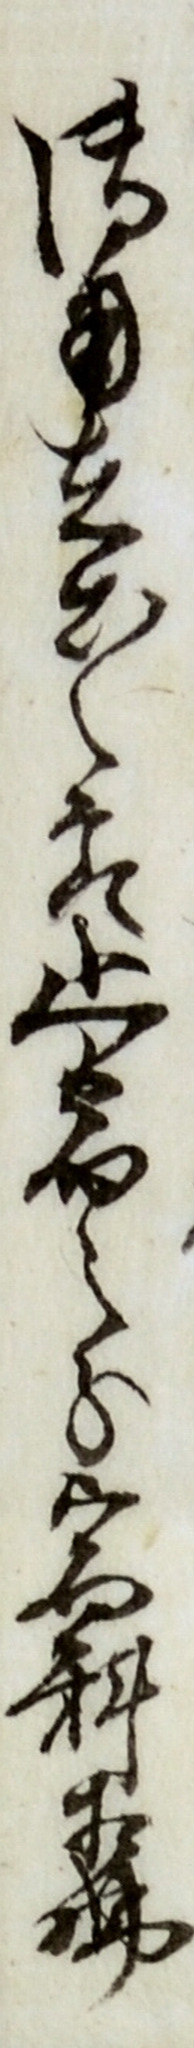御用在出候節止宿之分宿料相払
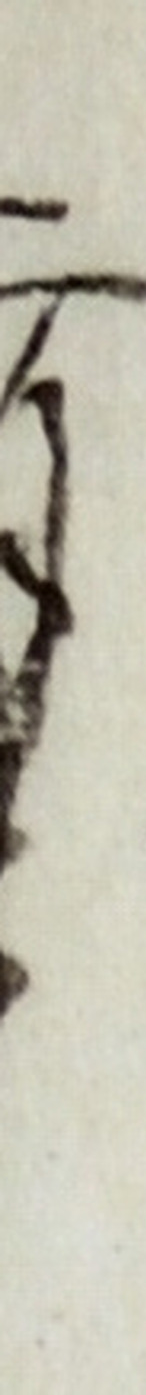二月廿日

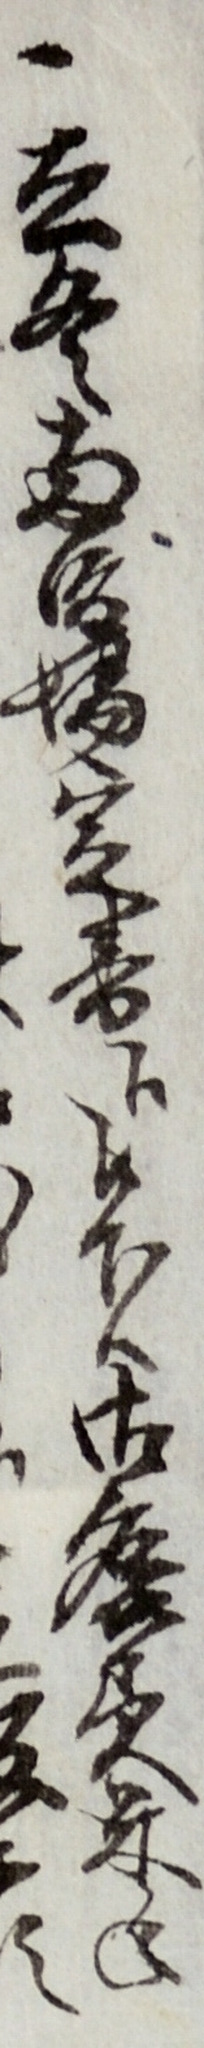一去冬両渡場定番江被下候御褒美米手
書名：御山方御薪方諸事御用留
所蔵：伊那市立高遠町図書館・合同会社AMANE
